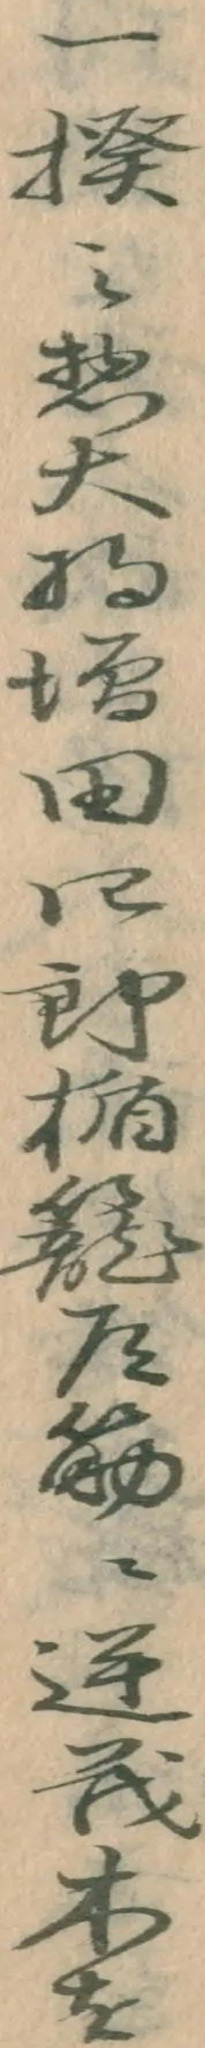一揆之惣大将増田四郎楯籠道筋に逆茂木を

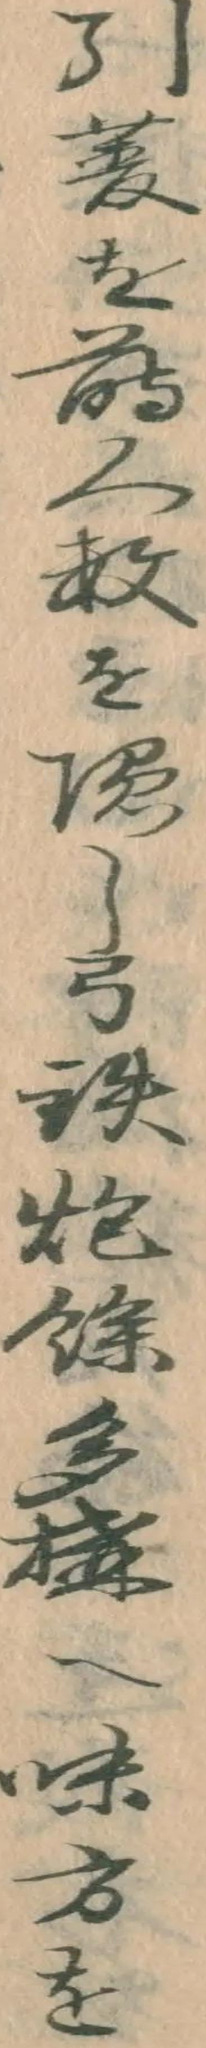引菱を蒔人数を隠し弓鉄炮余多構へ味方を
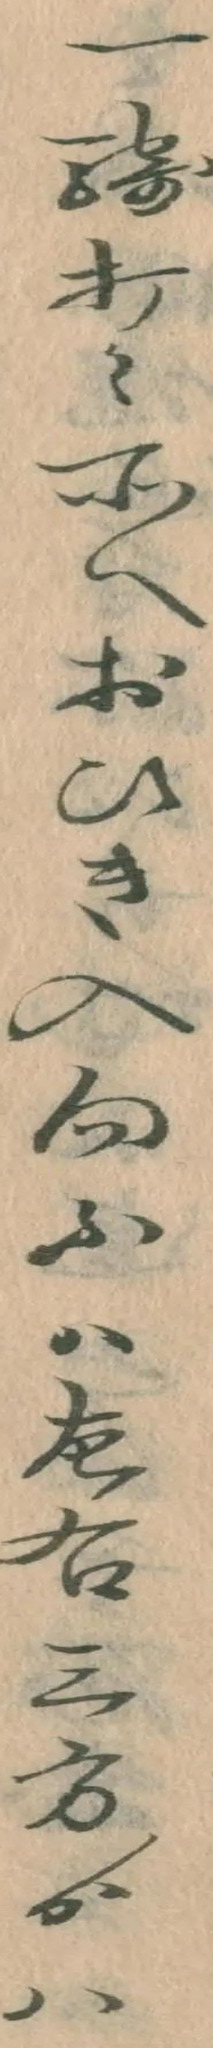一騎打て所へおひき入向ふは左右三方ゟは
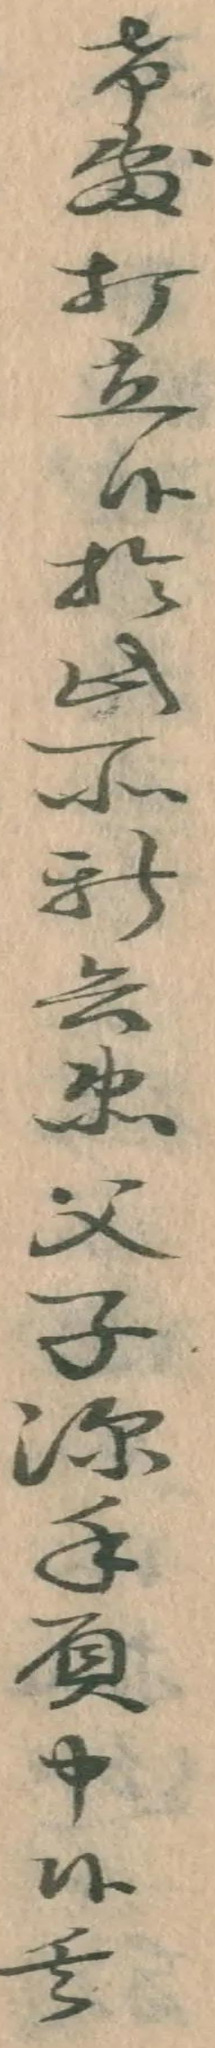希敷打立候於此所新兵衛父子深手負申候其
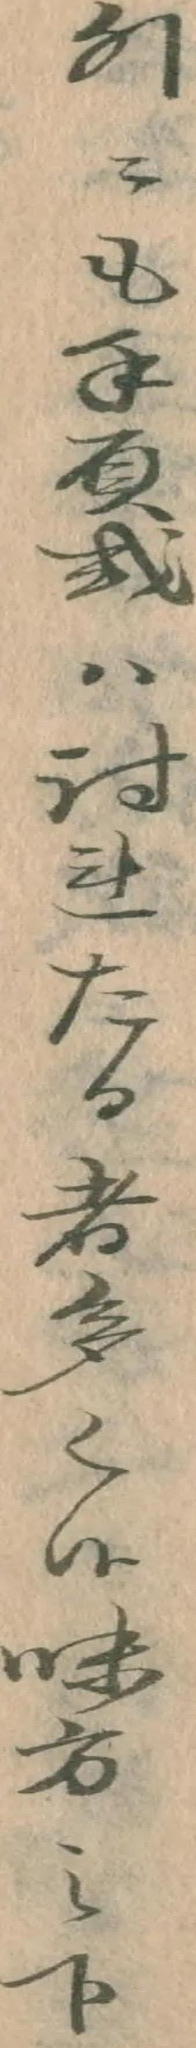外にも手負或は討れたる者多く候味方之下
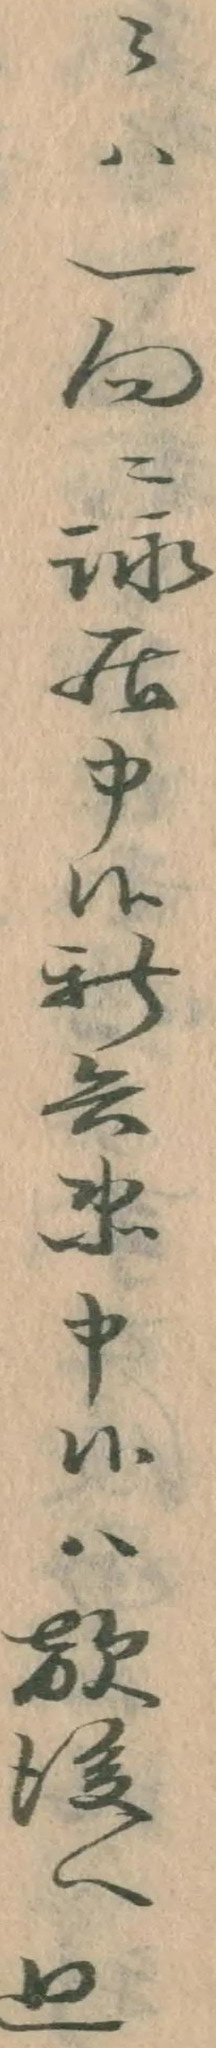らは一向に詠居申候新兵衛申候は敵後へ廻
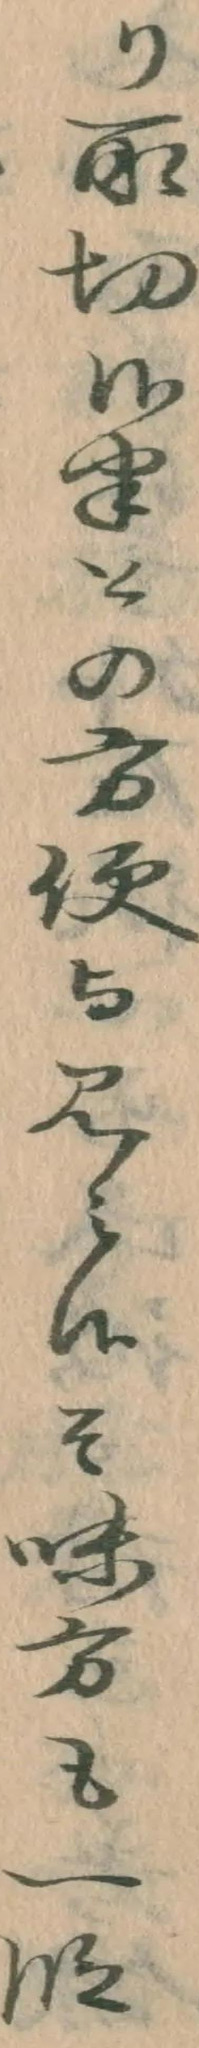り取切候半との方便与見之候そ味方も一段
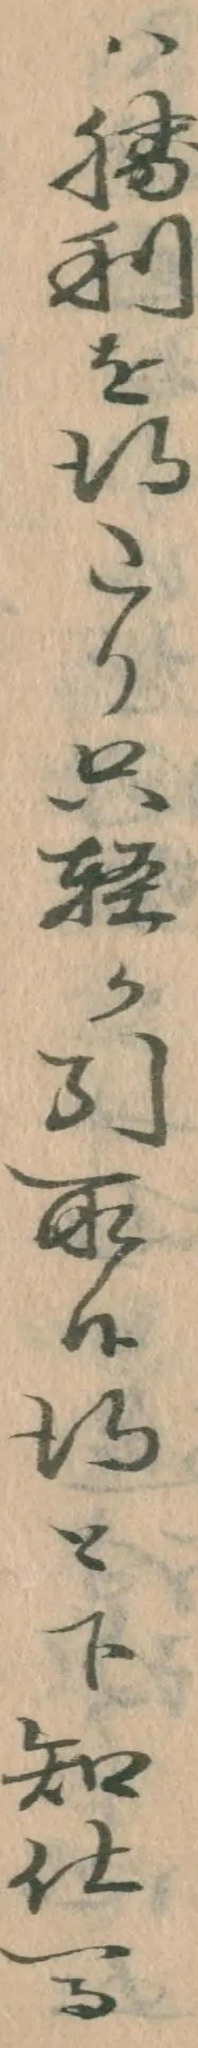は勝利を得たり只軽く引取候得と下知仕馬
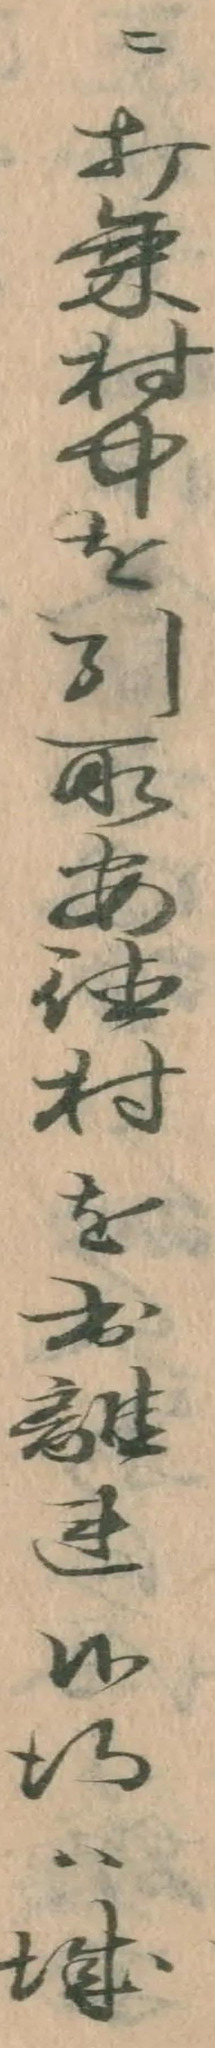に打乗村中を引取安徳村を出離れ候得は城
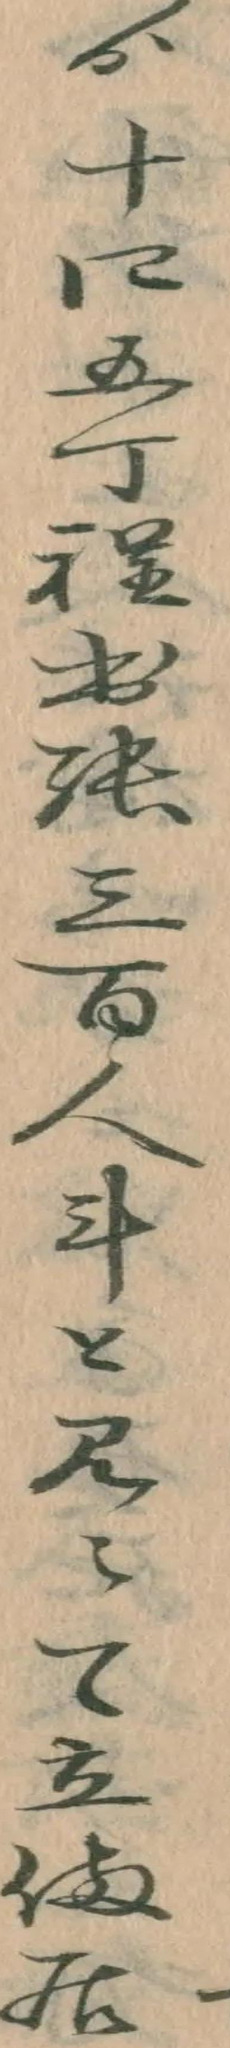ゟ十四五丁程出張三百人斗と見えて立備居
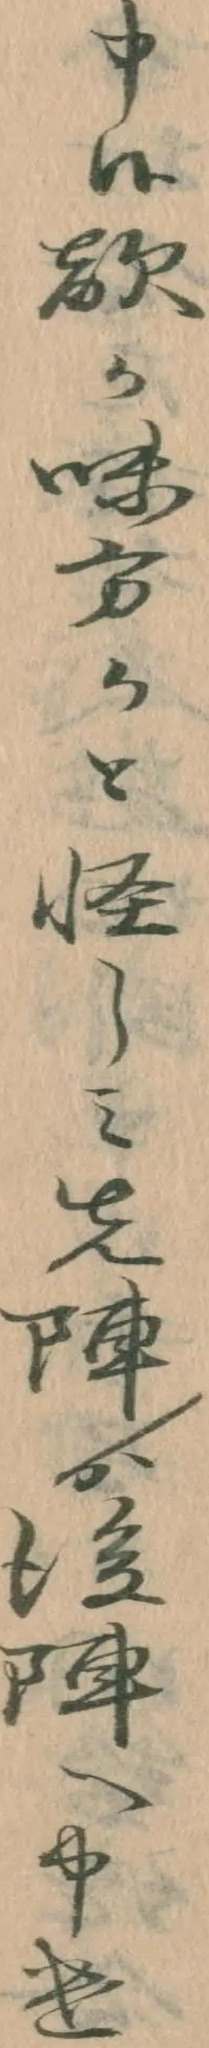申候敵か味方かと怪しみ先陣ゟ後陣へ申遣
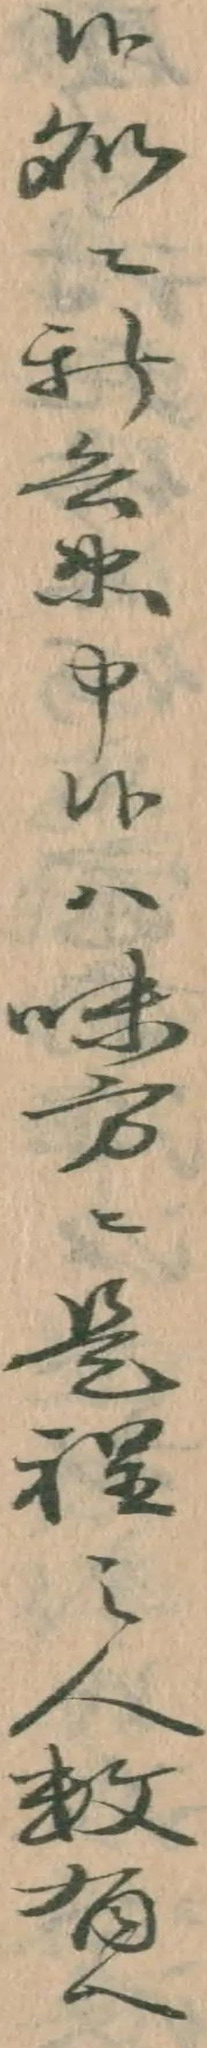候処に新兵衛申候は味方と是程之人数有へ
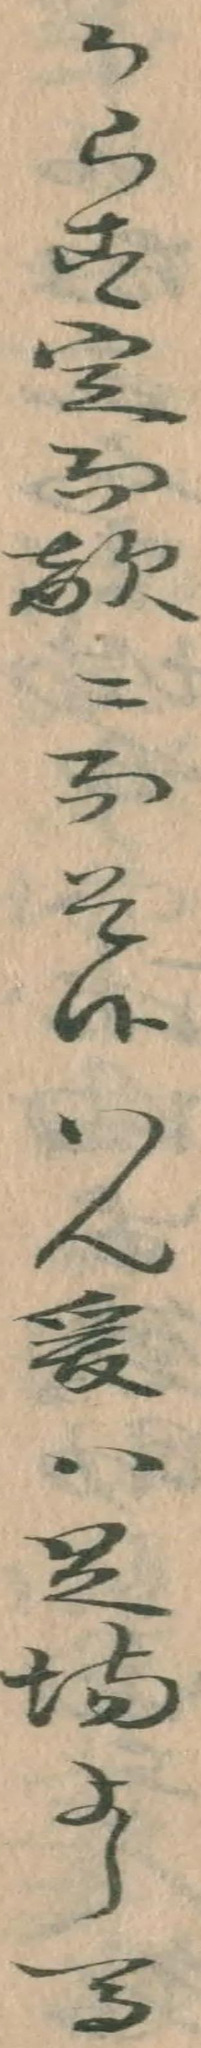からす定而敵に而そ候はん爰は足場よし馬
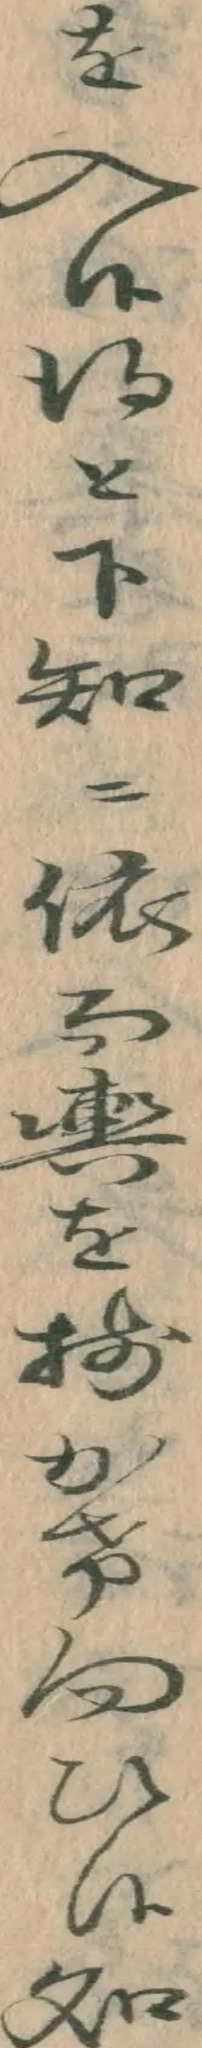を入候得と下知に依而輿を揃かけ向ひ候処
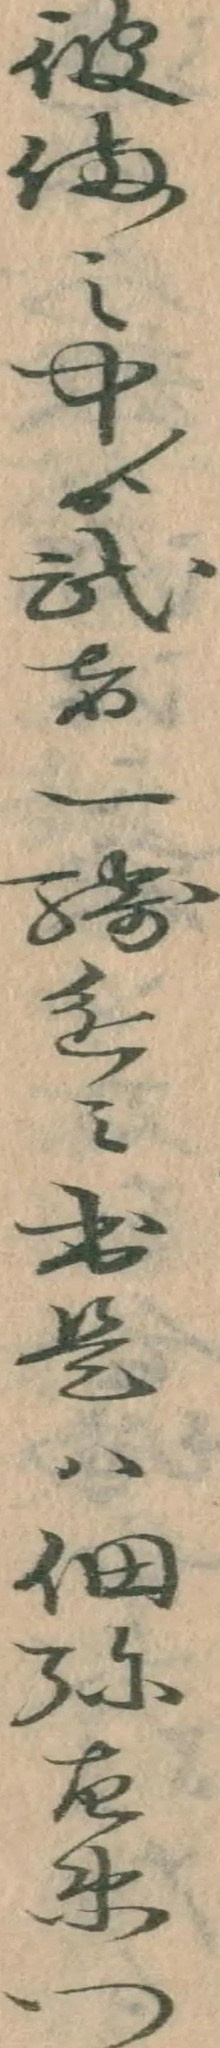彼備之中ゟ武者一騎進み出是は佃弥左衛門
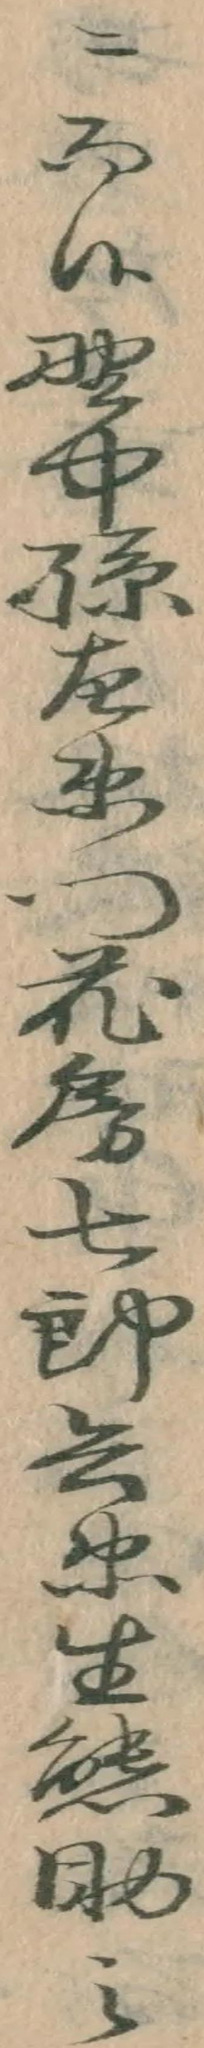に而候野中孫左衛門花房七郎兵衛生熊助之
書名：切支丹御退治記 49巻. [1]
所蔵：国立国会図書館 National Diet Library, JAPAN
